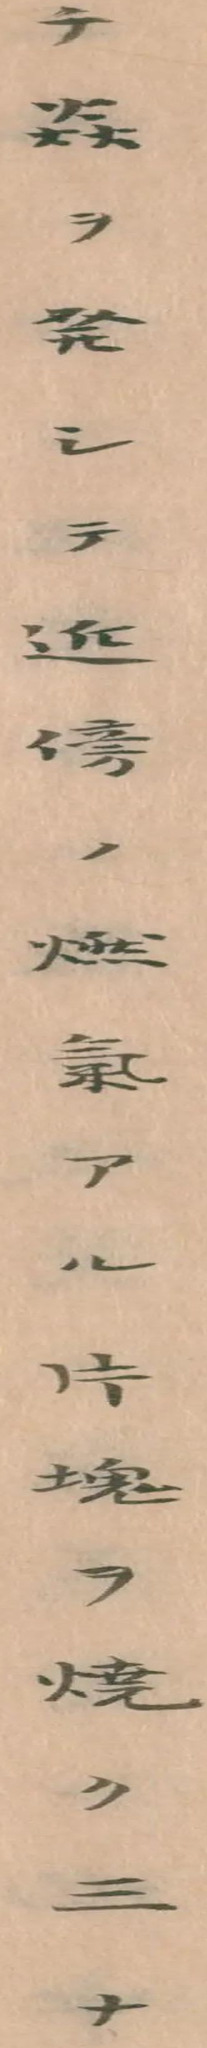チ焱ヲ発シテ近傍ノ燃気アル片塊ヲ焼ク三ナ
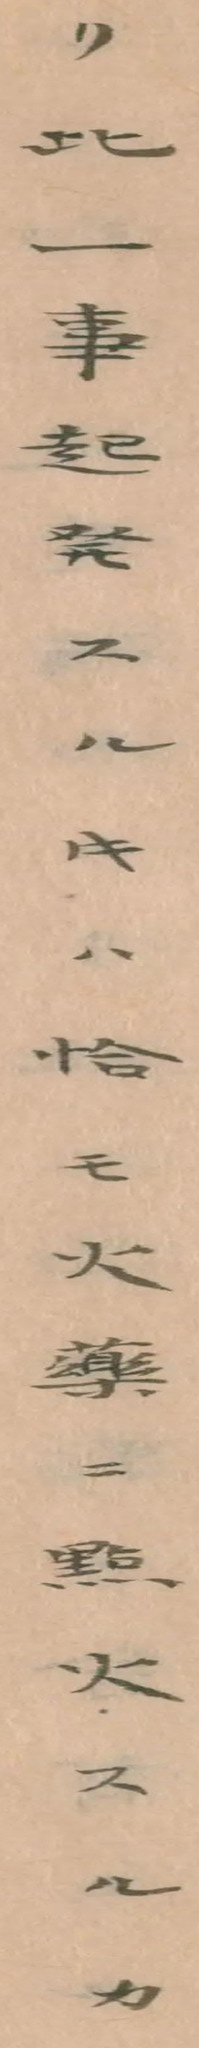り此一事起発スルトキハ恰モ火薬二点火スルカ
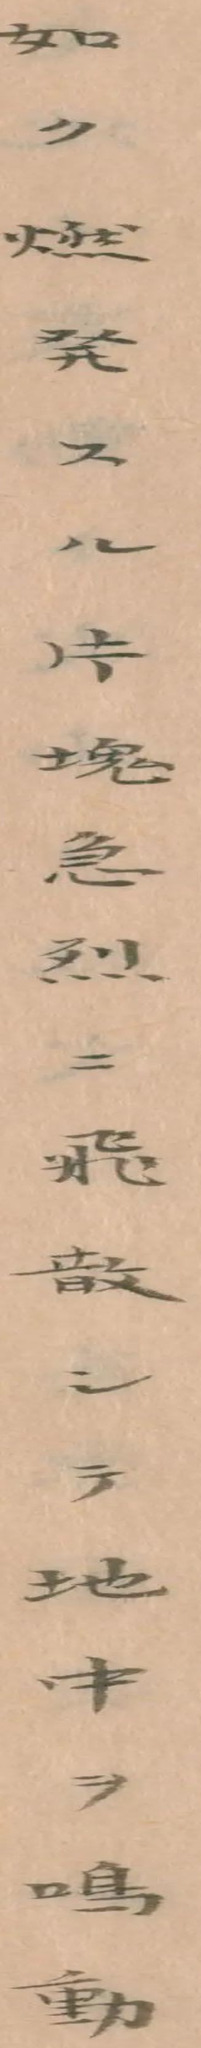如ク燃火スル片塊急烈二飛散シテ地中ヲ鳴動
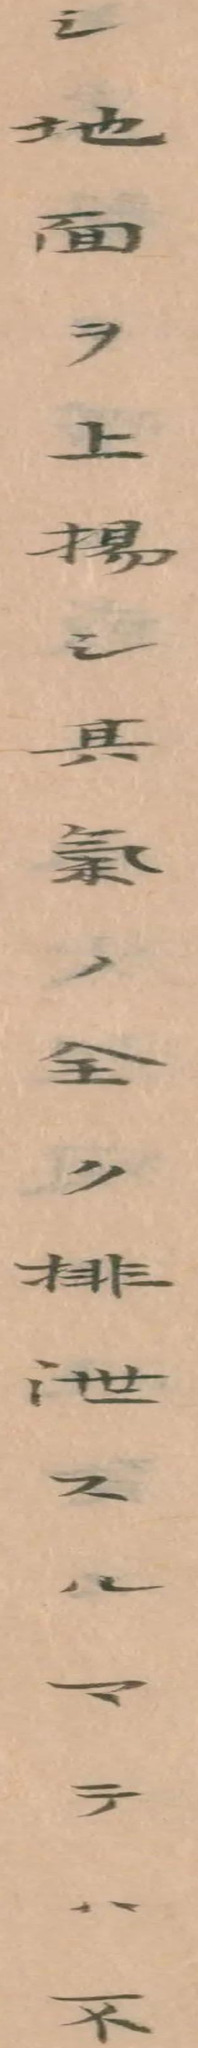シ地面ヲ上揚シ其気ノ全ク排泄スルマテハ不
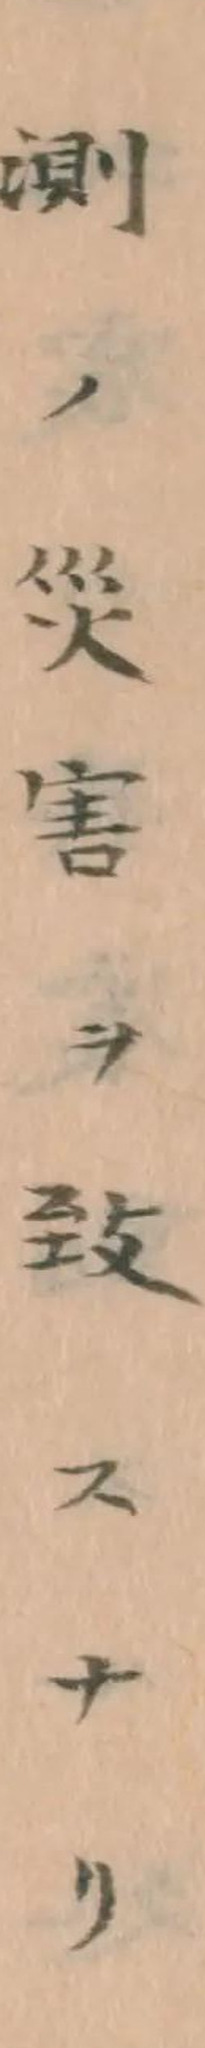測ノ災害二致スナリ
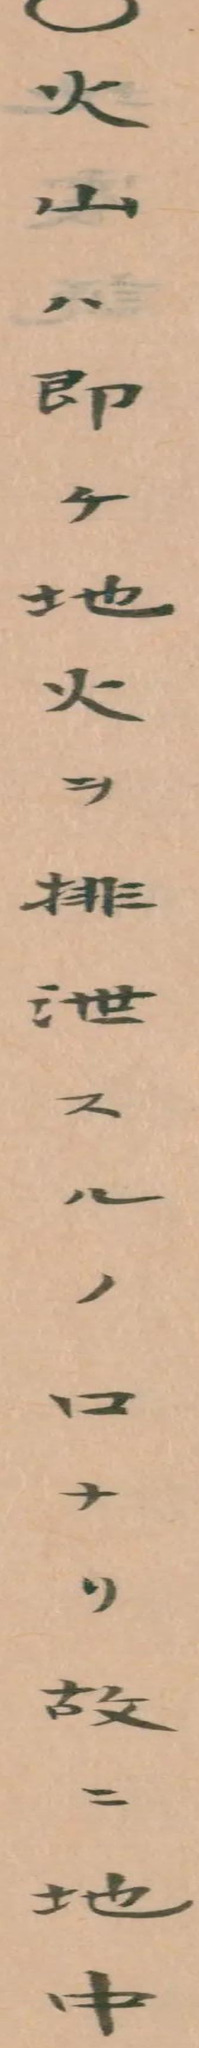〇火山ハ即チ地火ヲ排泄スルノ口ナリ故二地中
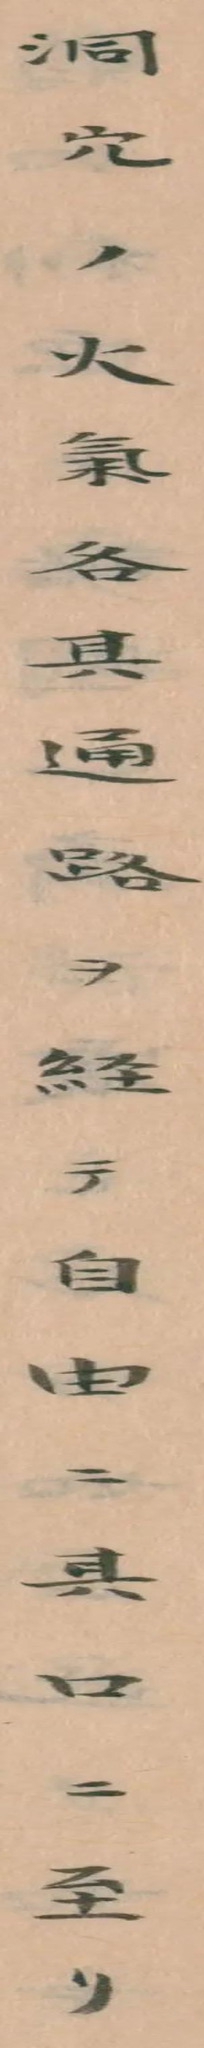洞穴ノ火気各其通路ヲ経テ自由二其口二至り
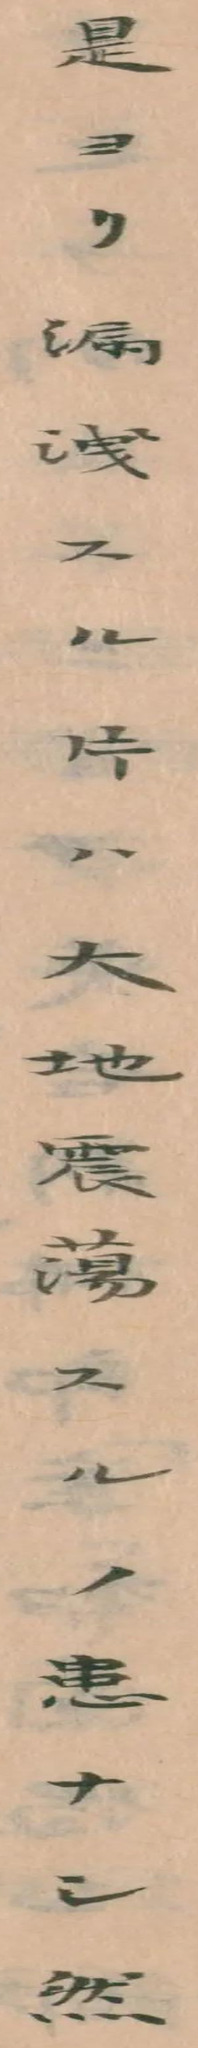是ヨリ漏洩スル片ハ大地震蕩スルノ患ナシ然
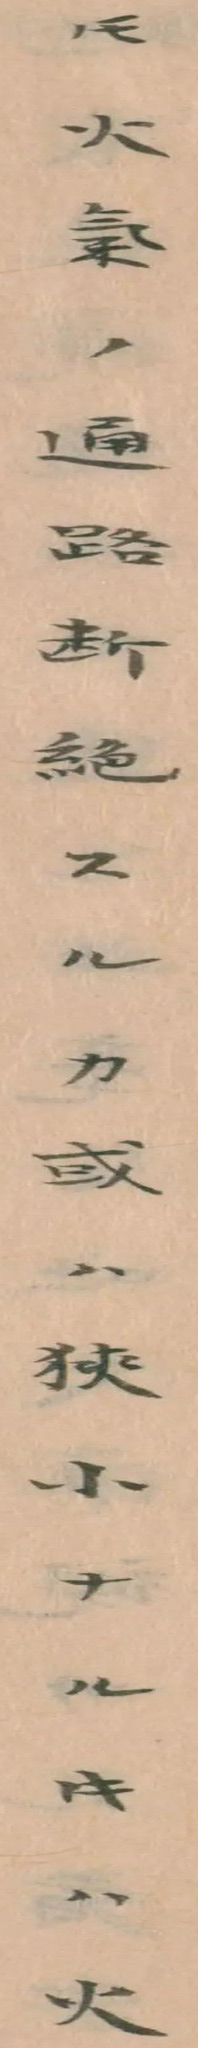トキ火気ノ通路断絶スルカ或ハ狭小ナルトキハ火
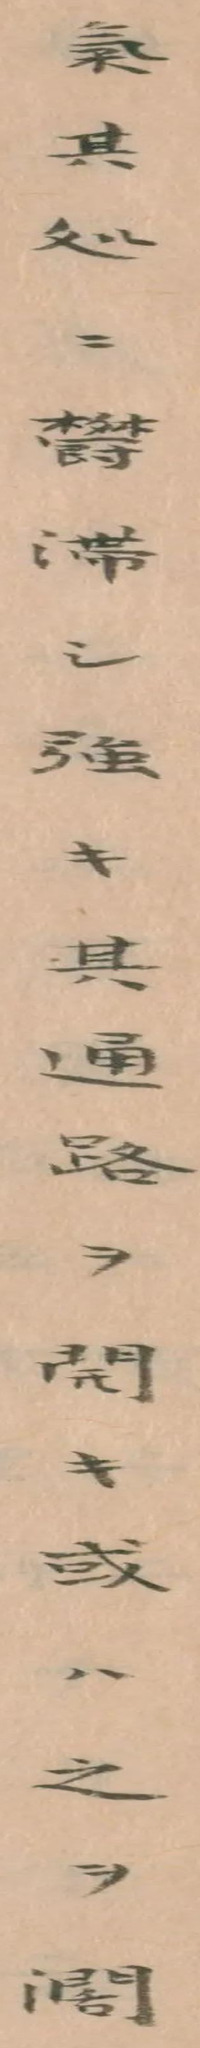気其処二欝滞シ強キ其通路ヲ開キ或ハ之ヲ潤
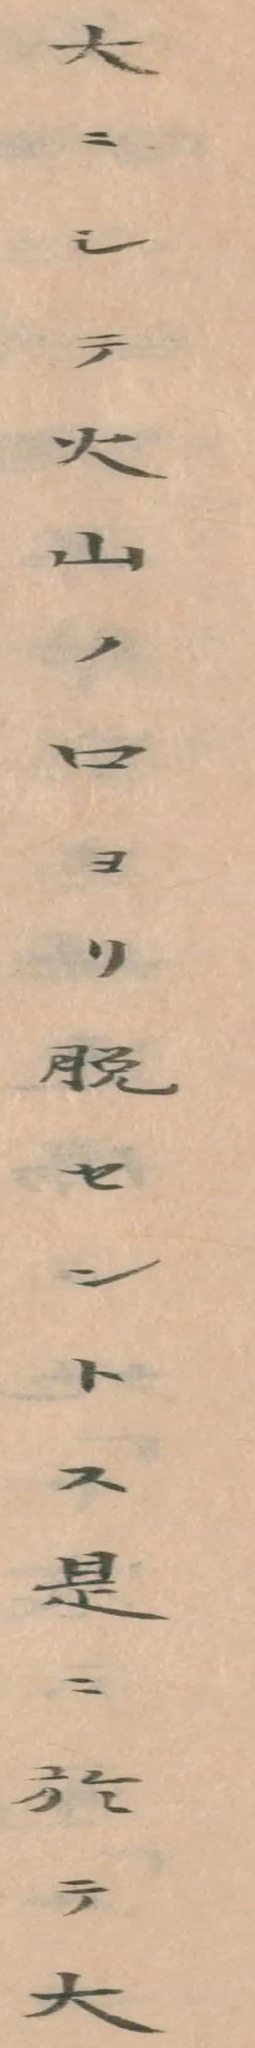大二シテ火山ノ口ヨリ脱セントス是ハ於テ大
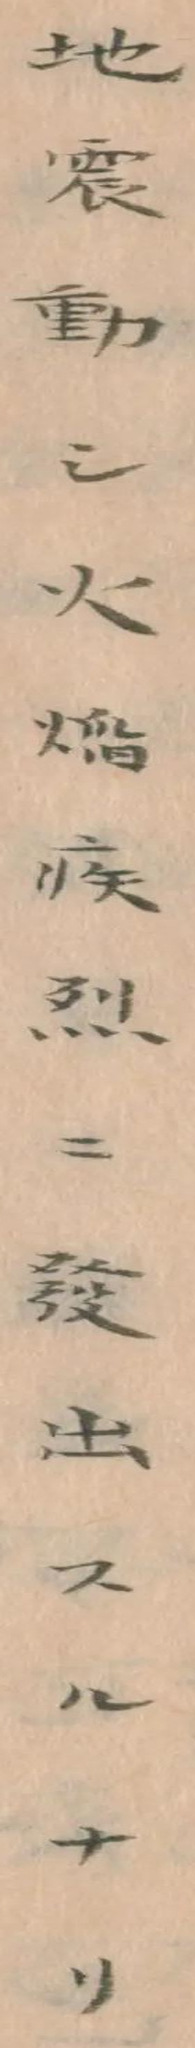地震動シ火焔疾烈二発出スルナリ
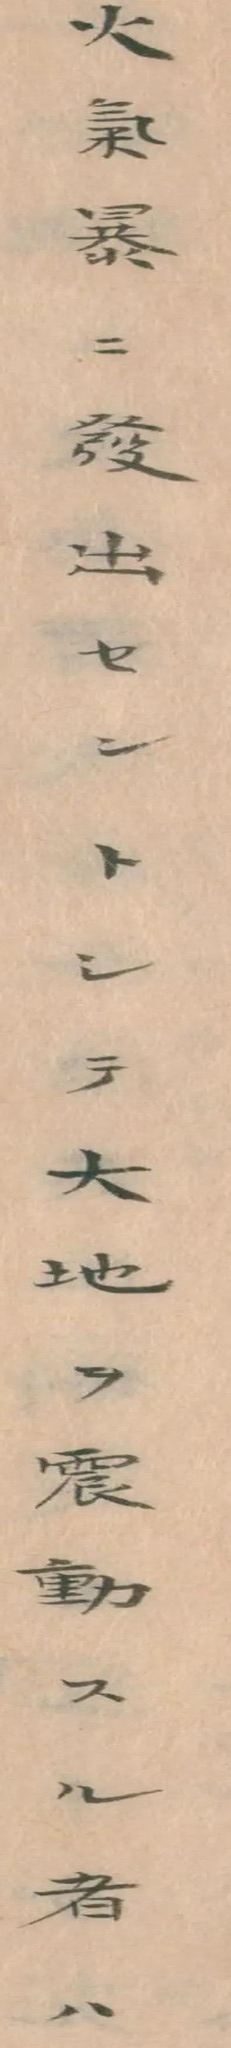火気暴二発出セントシテ大地ヲ震動スル者ハ
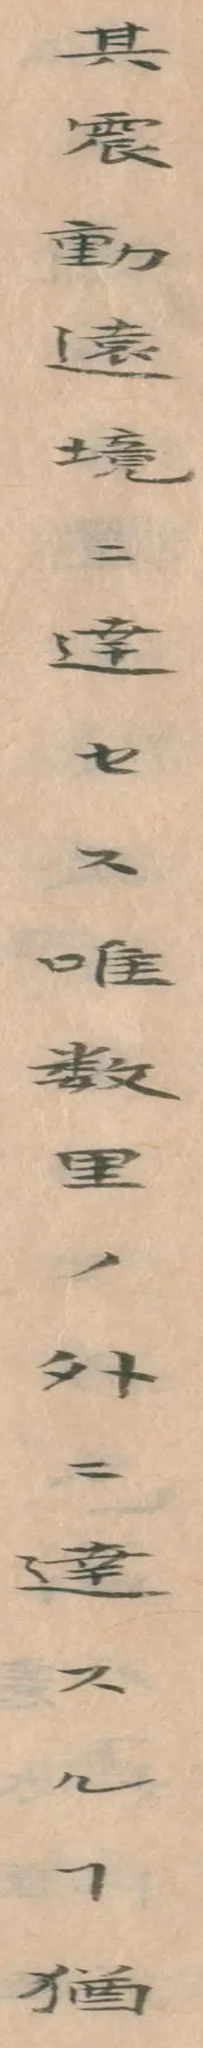其震動遠境二達セス唯数里ノ外二達スルコト猶
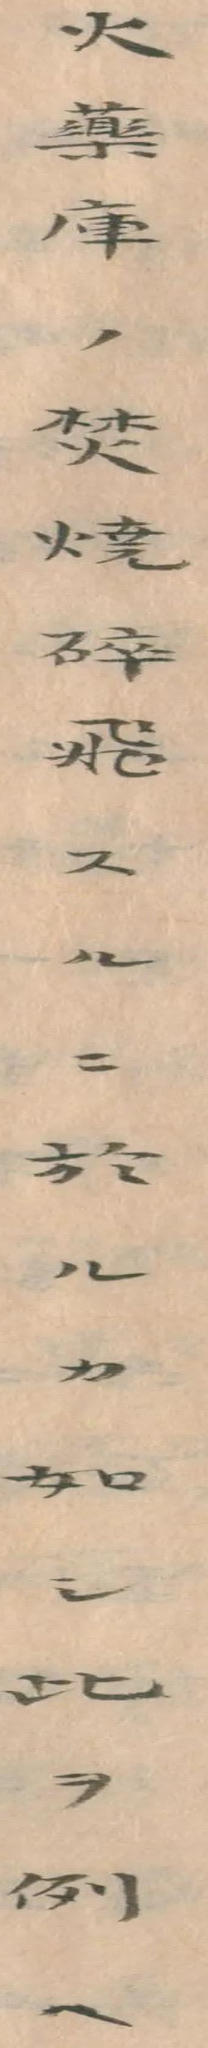火薬庫ノ焚焼砕飛スルニ於ルカ如シ此ヲ例へ

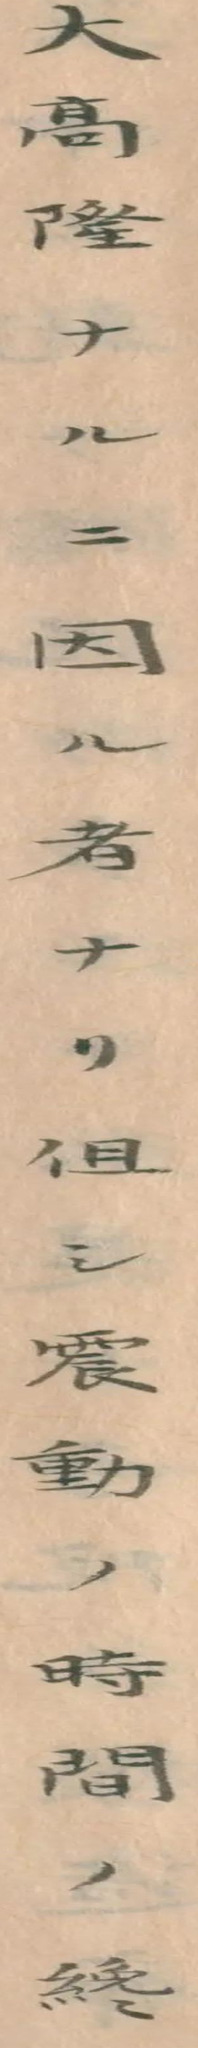大高隆ナル二因ㇽ者ナリ但シし震動ノ時間ノ纔
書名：地災撮要. 巻1(噴火山・地震ノ部)
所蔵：国立国会図書館 National Diet Library, JAPAN
